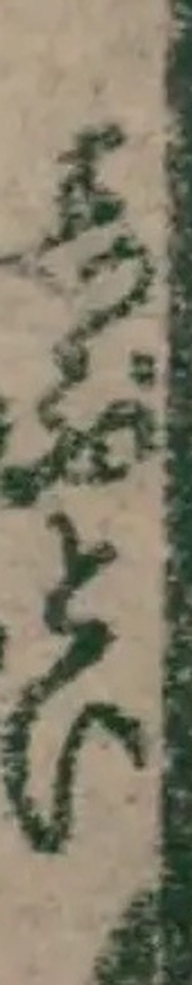しぶとい
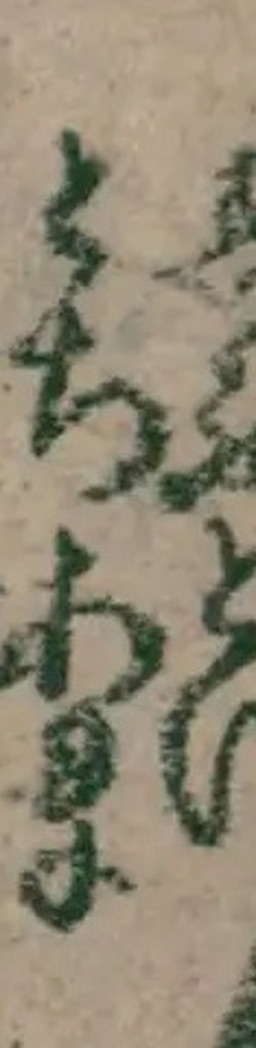とちあま
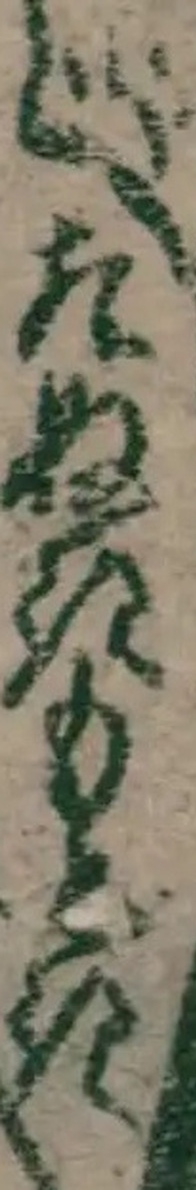たぬきもどき
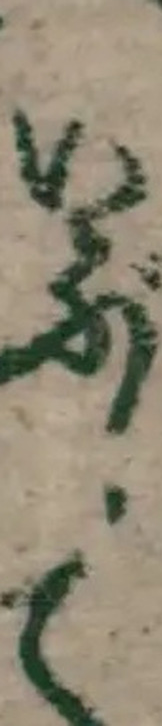いぶして
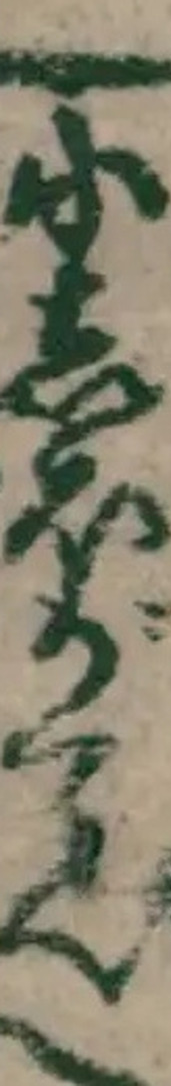小しほがてん
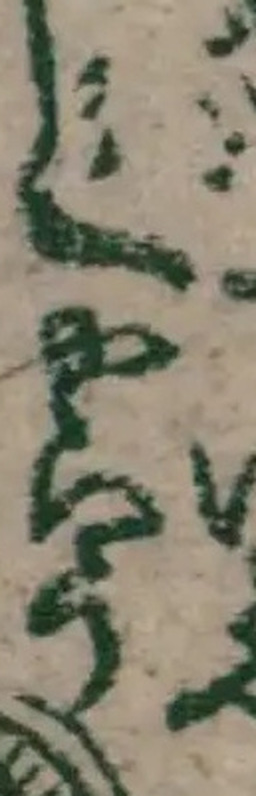やらう
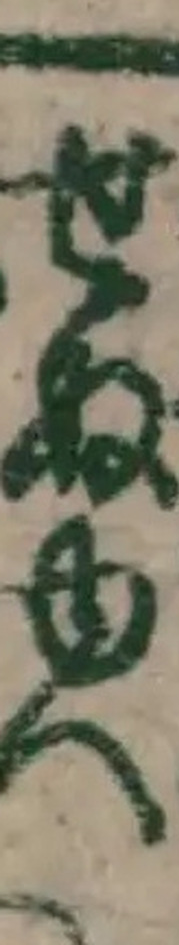せぬゆへ
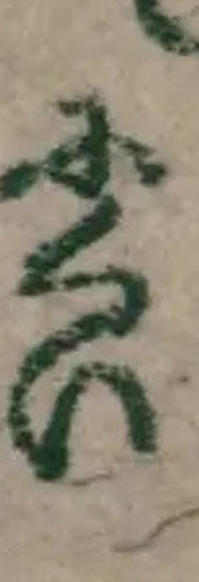にくい
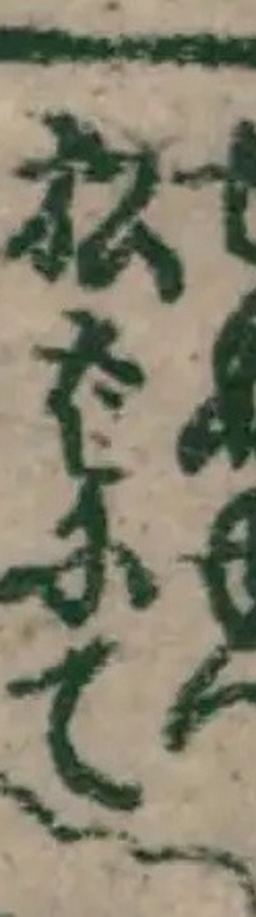松ばにて
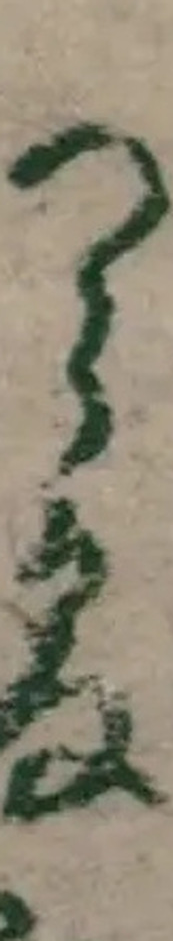つらかな
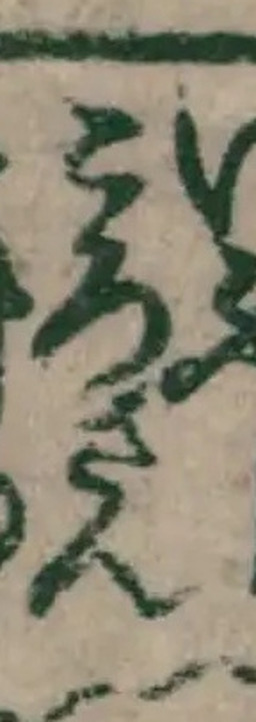ころさん
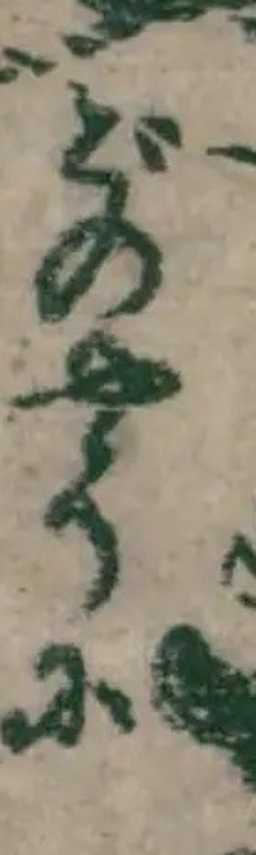どのやうに

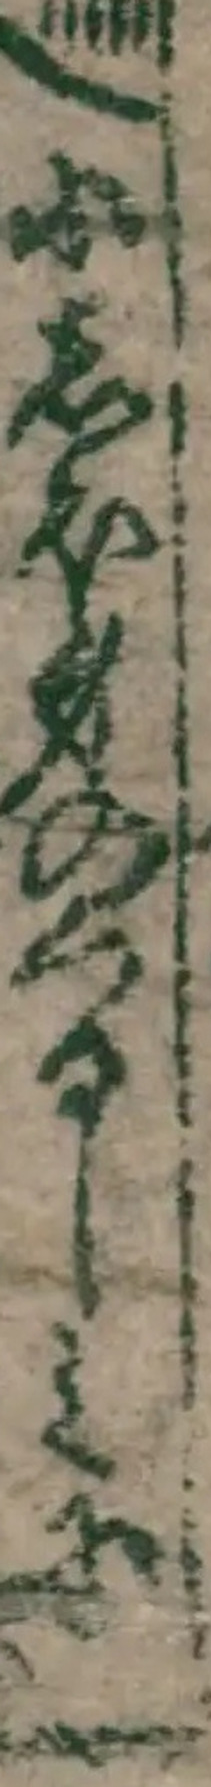小しほ身のくるしみに
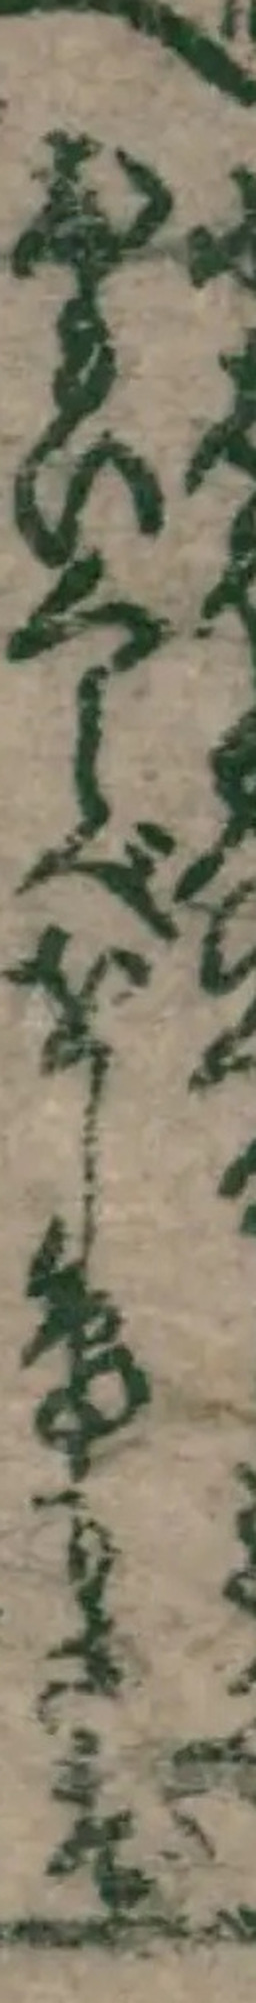おもいくらべをし鳥もさそ
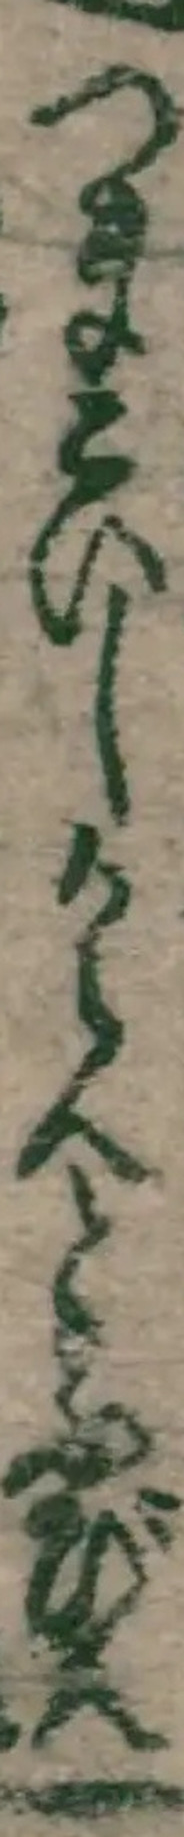つまこいしからんとふびんさ
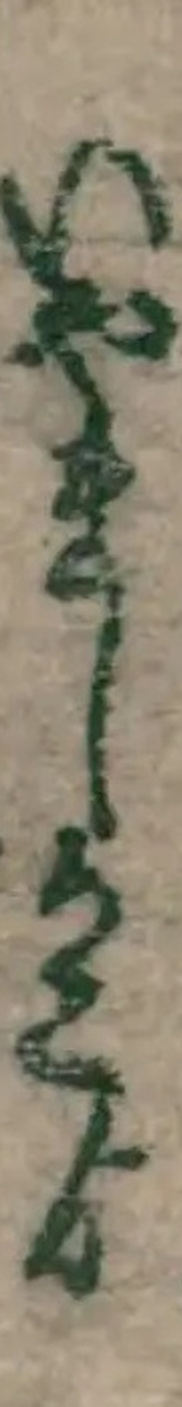いやましかこより
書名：塩売文太物語 2巻
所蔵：国立国会図書館 National Diet Library, JAPAN
